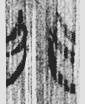行
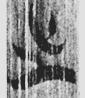之
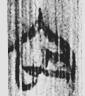含（今）
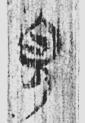○（視）
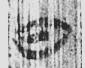日
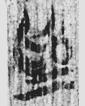爲
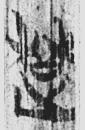楚
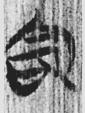命（令）
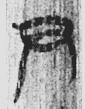尹
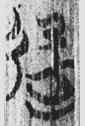○（坐）
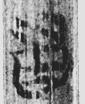○（友）
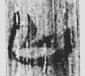亡（無）
